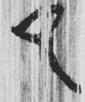已
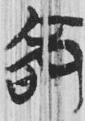命（令）
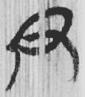尹
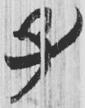子
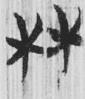林
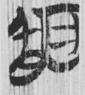䎽（問）
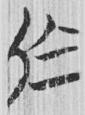於
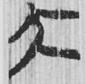大（太）
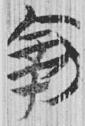○（宰）
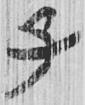子
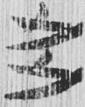歨（之）
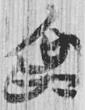爲
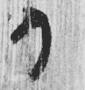人
